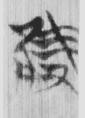蒦
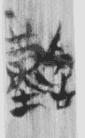懃
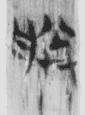朕
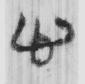心
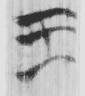王
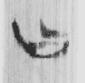曰
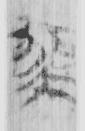{聑大}
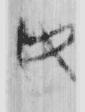女
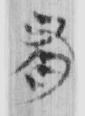有
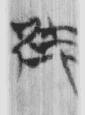隹
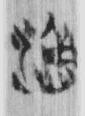{沈臼}
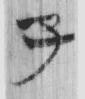子
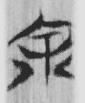余
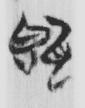既
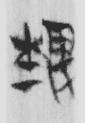埶
